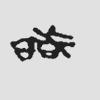睹
